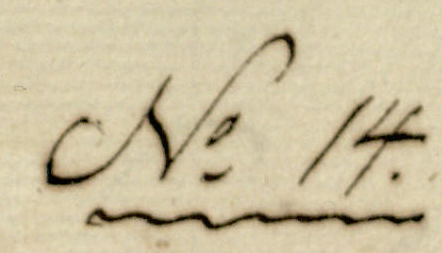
No 14 .
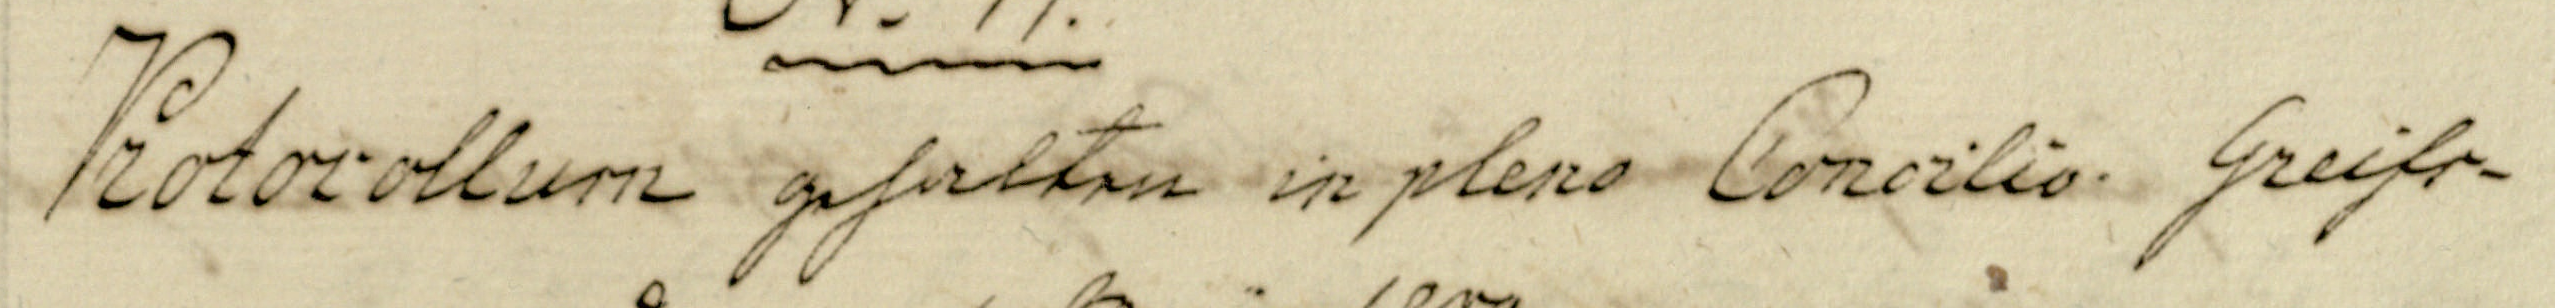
Protocollum gehalten in pleno Concilio Greifs¬
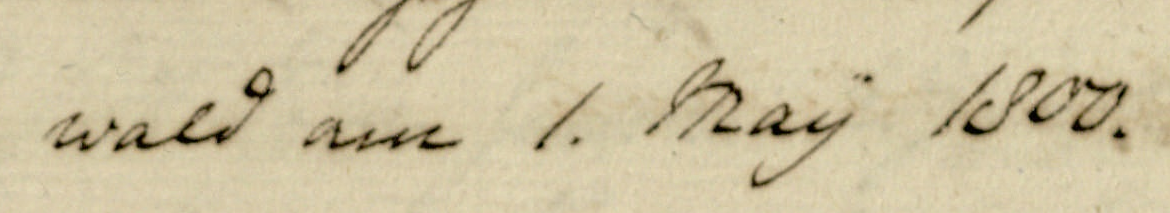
wald am 1. Maÿ 1800.
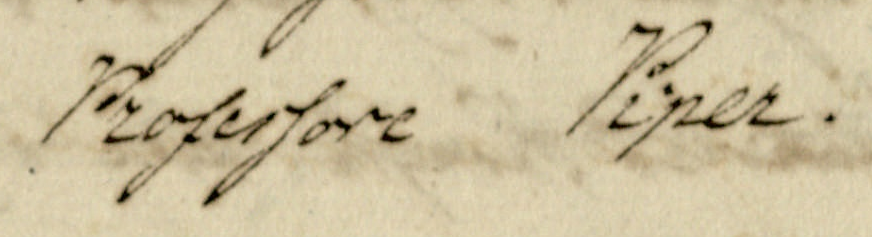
Professore Piper.
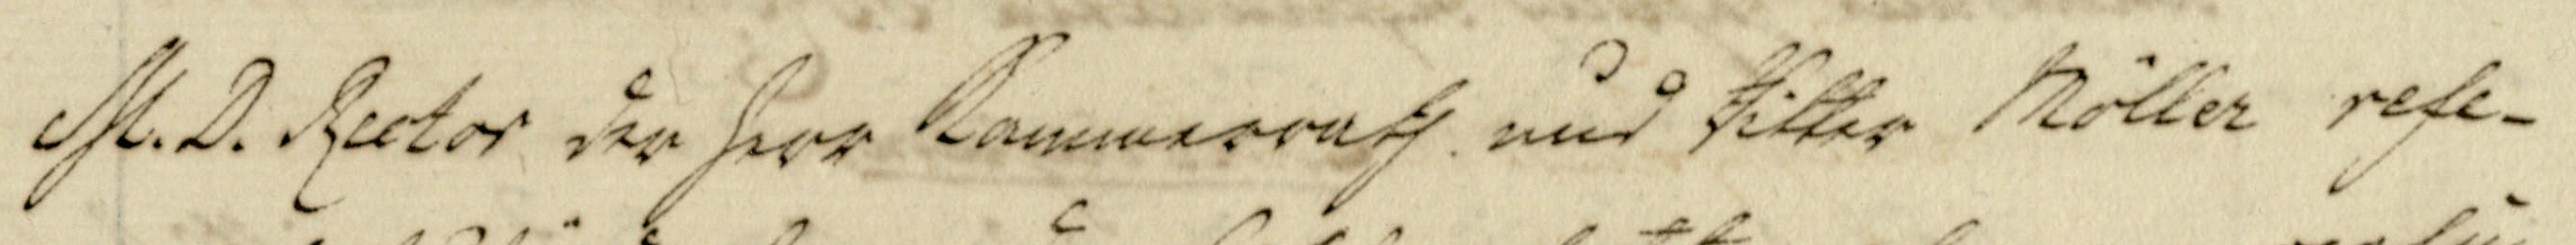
M. D. Rector der Herr Kammerrath und Ritter Möller refe¬
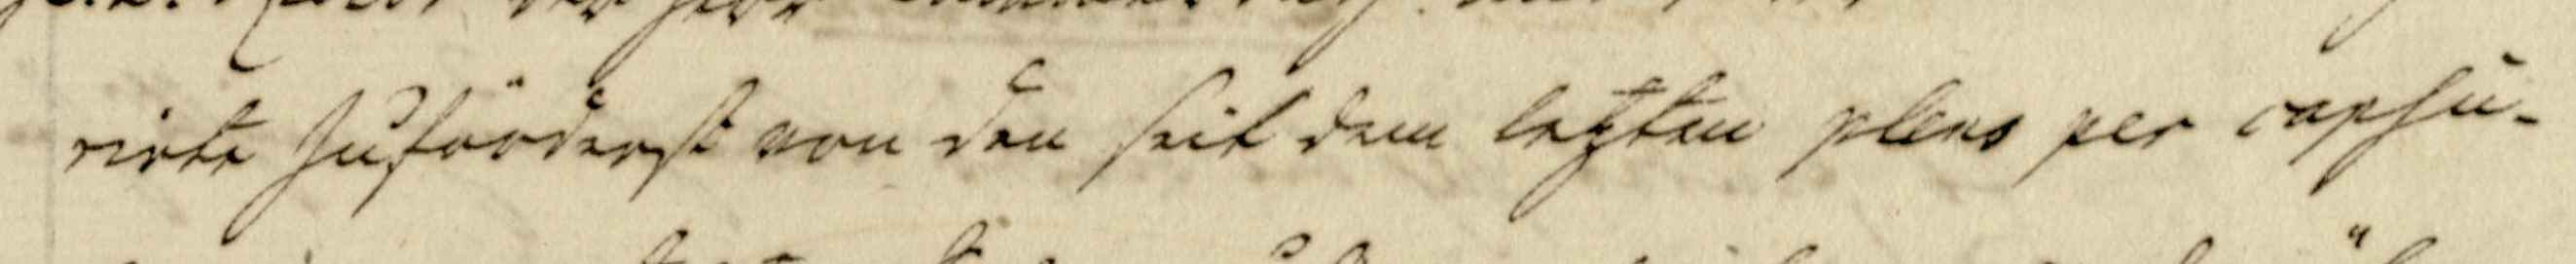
rirte zuförderst von den seit dem letzten pleno per capsu¬
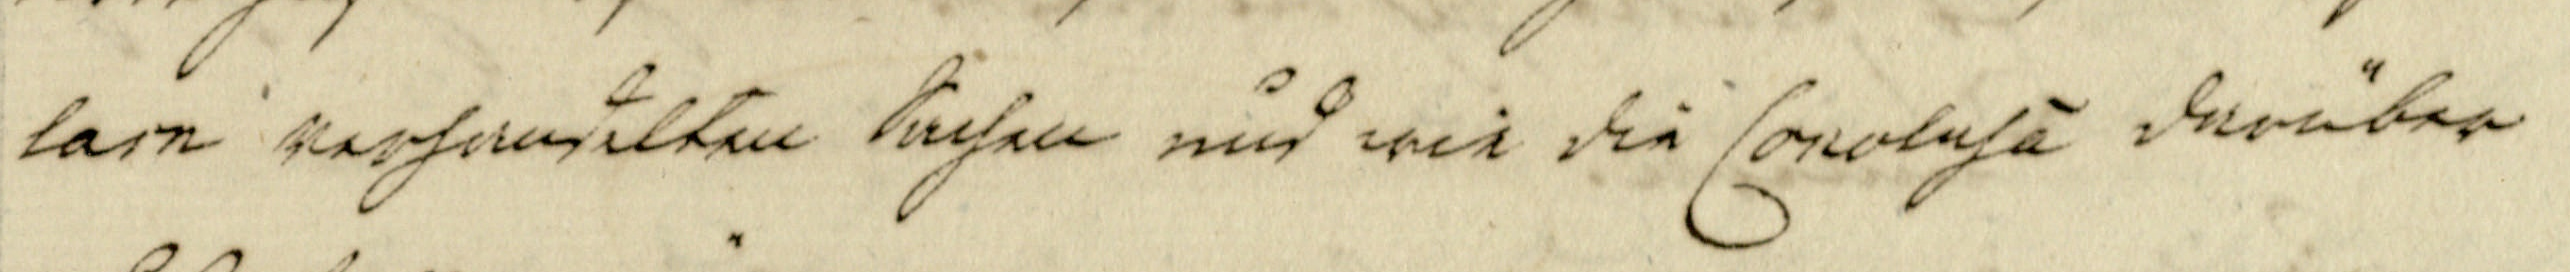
lam verhandelten Sachen und wie die Conclusa darüber
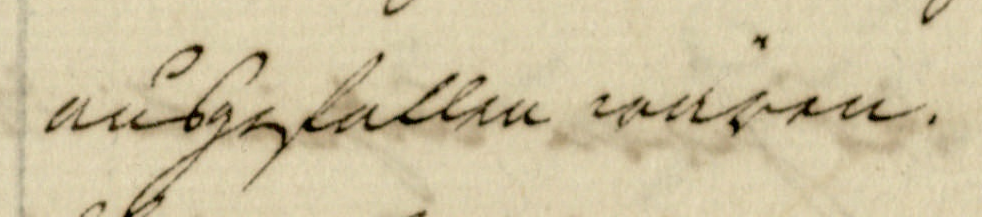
ausgefallen wären.
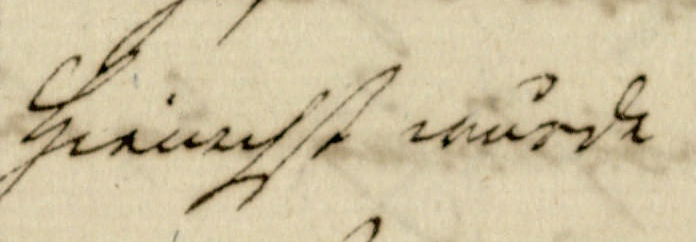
Hienechst wurde
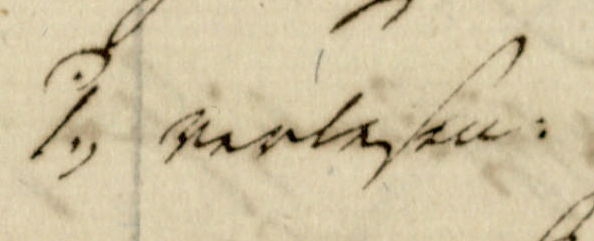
1., verlesen:
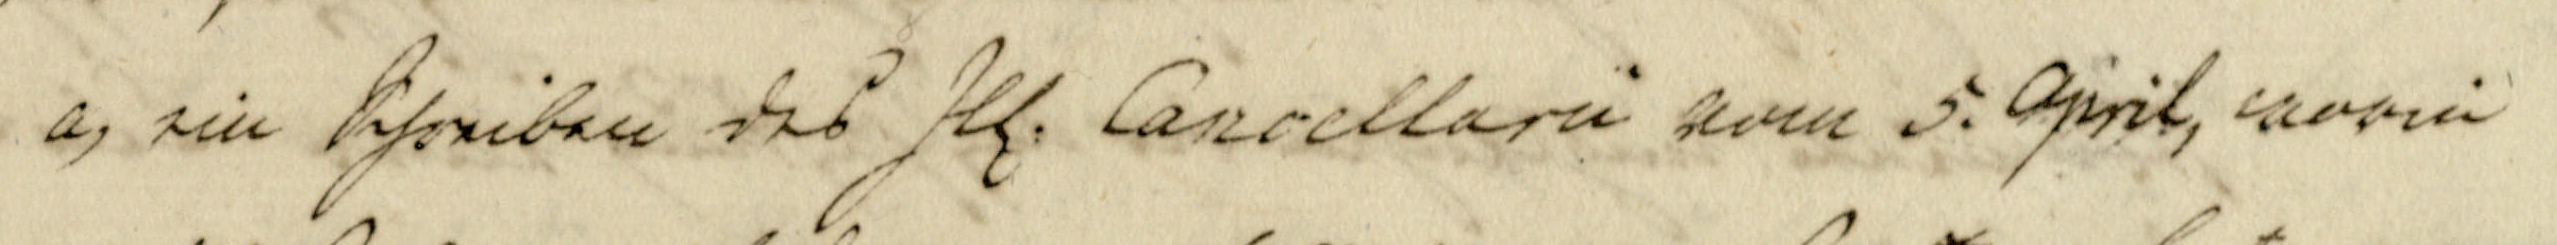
a, ein Schreiben des Ill. Cancellarii vom 5. April, worin
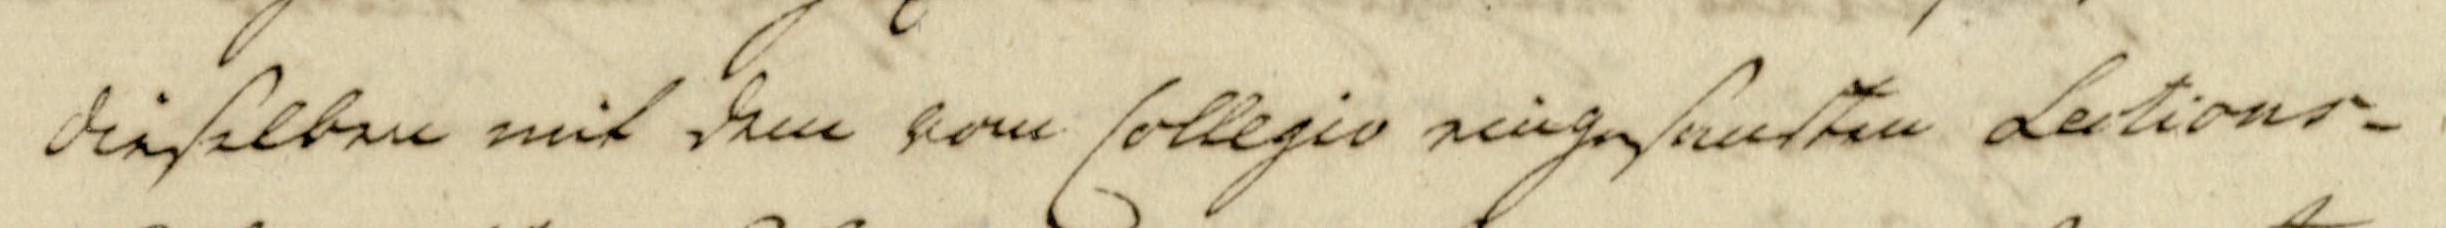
dieselben mit dem vom Collegio eingesandten Lections¬
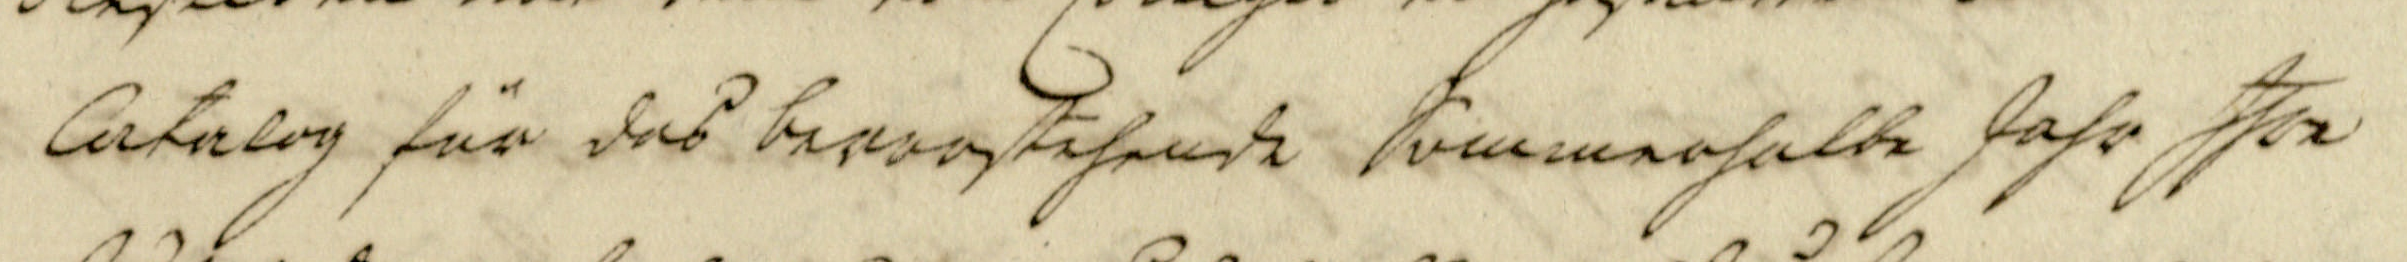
Catalog für das bevorstehende Sommerhalbe Jahr Ihre
